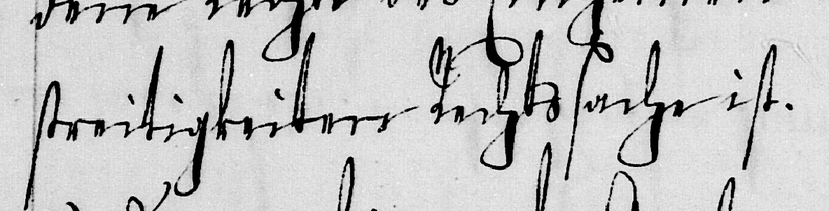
streitigkeiten Rechtssache ist.
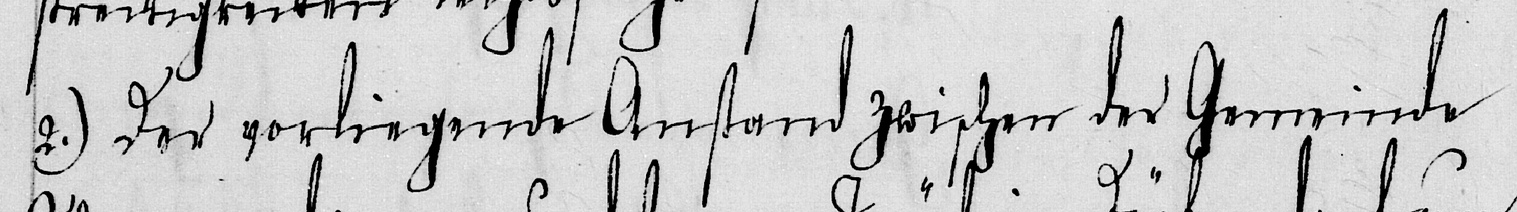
2.) Der vorliegende Anstand zwischen der Gemeinde
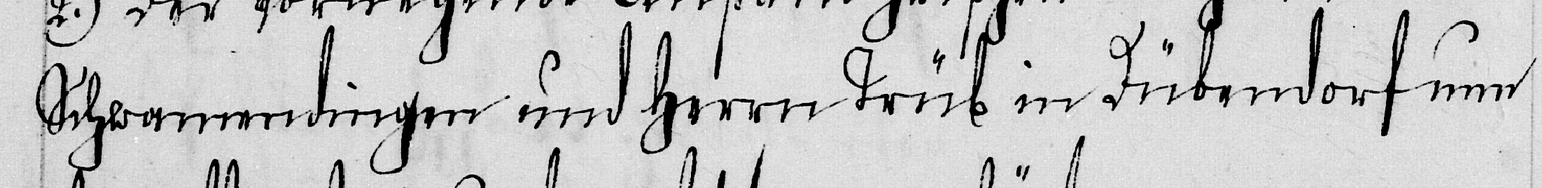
Schwamendingen und Herrn Trüb in Dübendorf nun
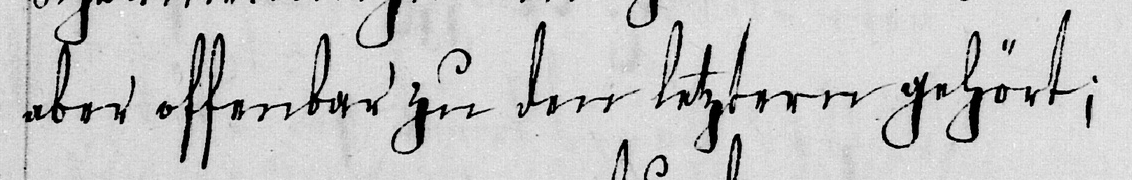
aber offenbar zu den letztern gehört;
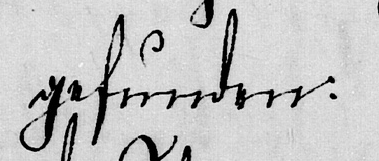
gefunden:
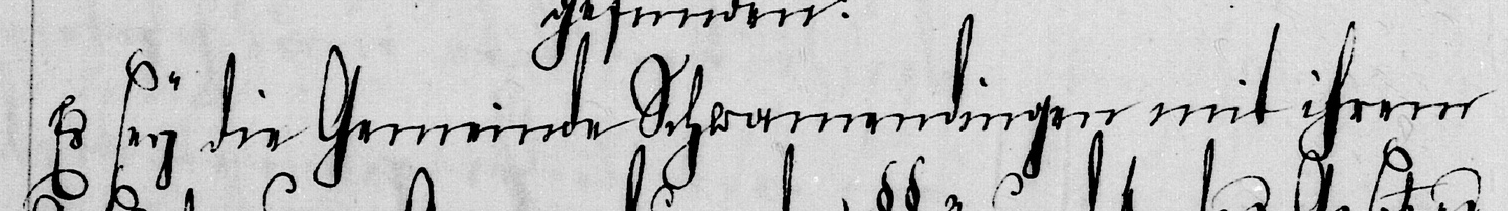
Es sey die Gemeinde Schwamendingen mit ihrem
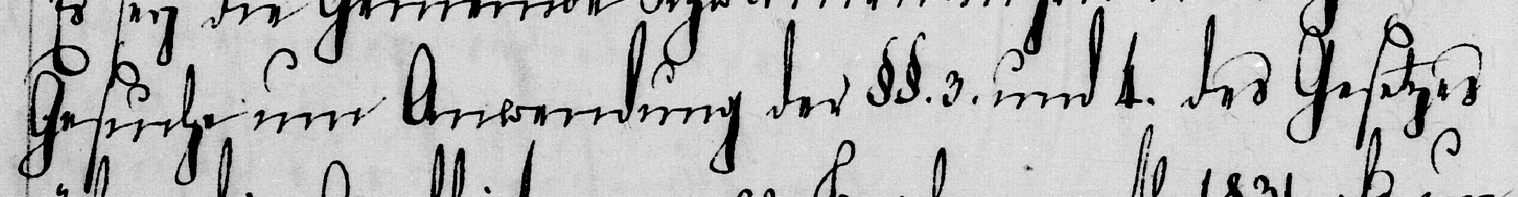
Gesuche um Anwendung der §§. 3. und 4. des Gesetzes
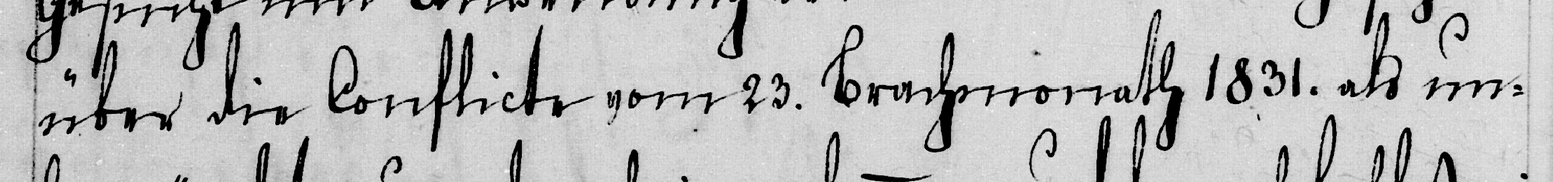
über die Conflicte vom 23. Brachmonath 1831. als un¬
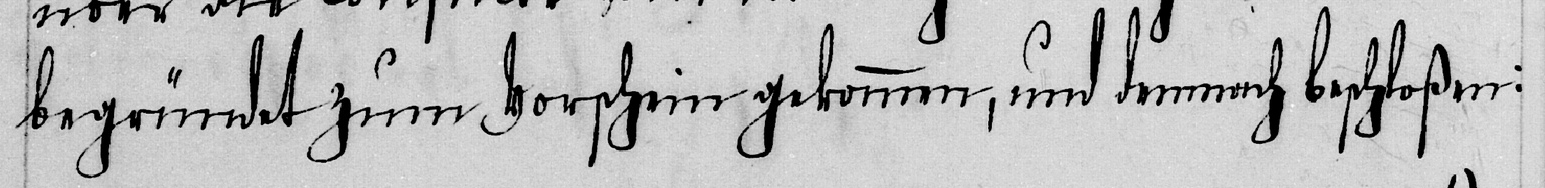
begründet zum Vorschein gekommen, und demnach beschlosse¬
